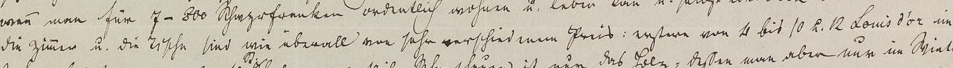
Die Zimmer u. die Tische sind wie überall von sehr verschiedenem Preis: erstere von 4 bis 10 u. 12 Louis d'or im
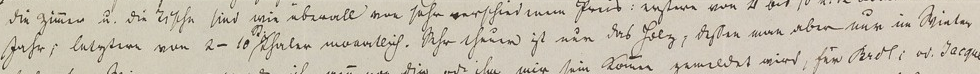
Jahr; letztere von 2–10 R. Thaler monatlich. Sehr theuer ist nur das Holz, dessen man aber nur im Winter
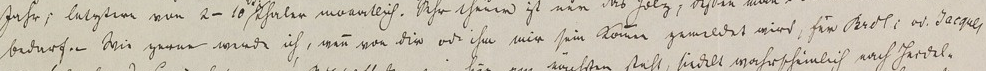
bedarf. – Wie gerne werde ich, wenn von dir od. ihm mir sein Kommen gemeldet wird, für Brdli od. Jacques
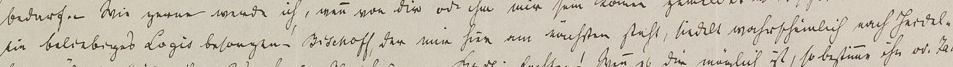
ein beliebiges Logis besorgen. Bischoff, der mir hier am nächsten steht, siedelt wahrscheinlich nach Heidel-
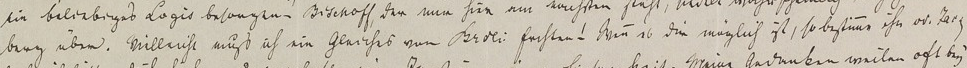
berg über. Vielleicht muss ich ein Gleiches von Brdli frchten! Wenn es dir möglich ist, so bestimme ihn od. Jacq.
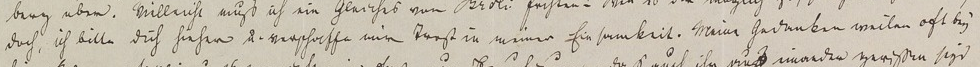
doch, ich bitte dich hieher u. verschaffe mir Trost in meiner Einsamkeit. Meine Gedanken weilen oft bey
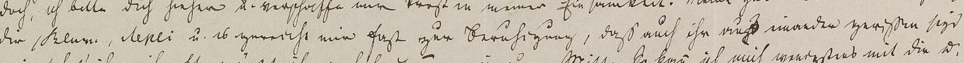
dir, Blum., Aepli u. es gereicht mir fast zur Beruhigung, dass auch ihr aus einander gerissen seyd
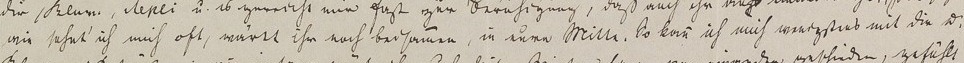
wie sehnt' ich mich oft, wäret ihr noch beisammen, in eure Mitte. So kann ich mich wenigstens mit dir u.
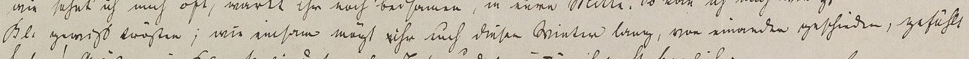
Bl. gewiss trösten; wie einsam mögt ihr euch diesen Winter lang, von einander geschieden, gefühlt
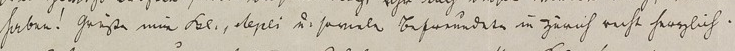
haben! Grüsse mir Bl., Aepli u. so viele Befreundete in Zürich recht herzlich.
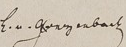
E. v. Gonzenbach
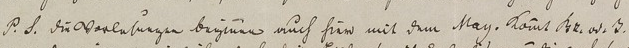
P. S. Die Vorlesungen beginnen auch hier mit dem May. Kommt Br. od. J.
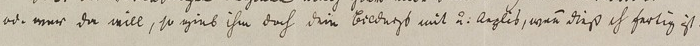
od. wer da will, so gieb ihm doch dein Bildniss mit u: Aeplis, wenn diess auch fertig ist.
